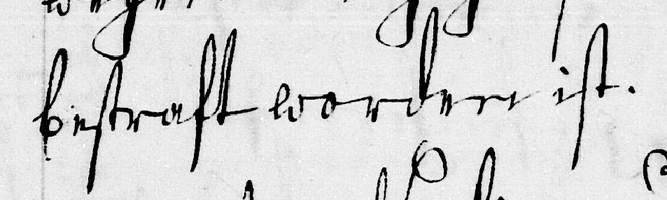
bestraft worden ist.
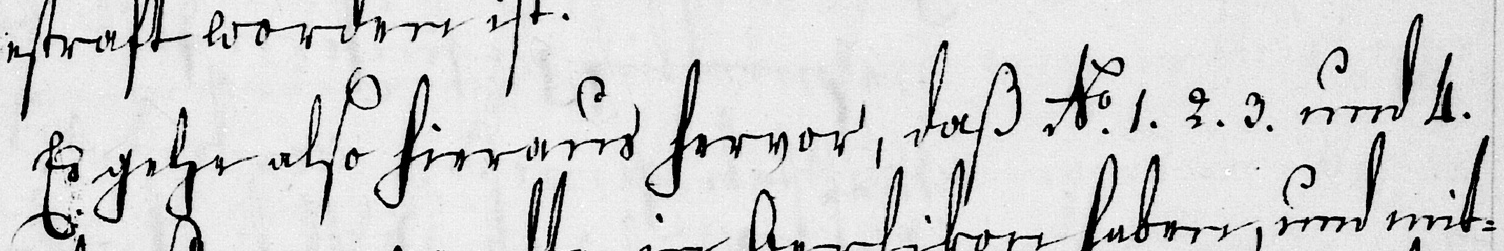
Es gehe also hieraus hervor, daß No. 1. 2. 3. und 4.
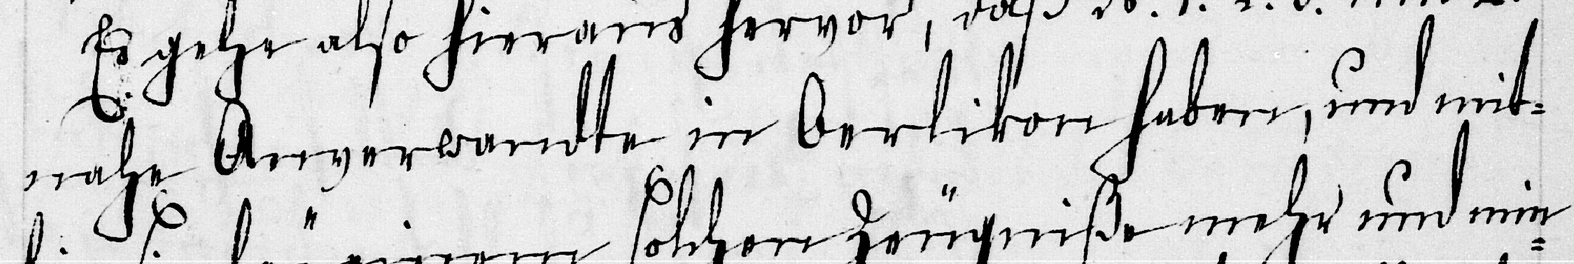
nahe Anverwandte in Oerlikon haben, und mit¬
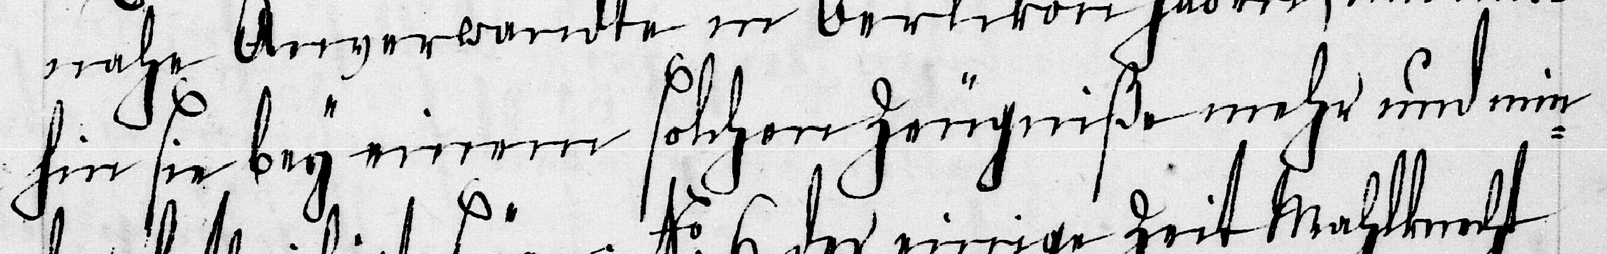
hin sie bey einem solchen Zeugniße mehr und min¬
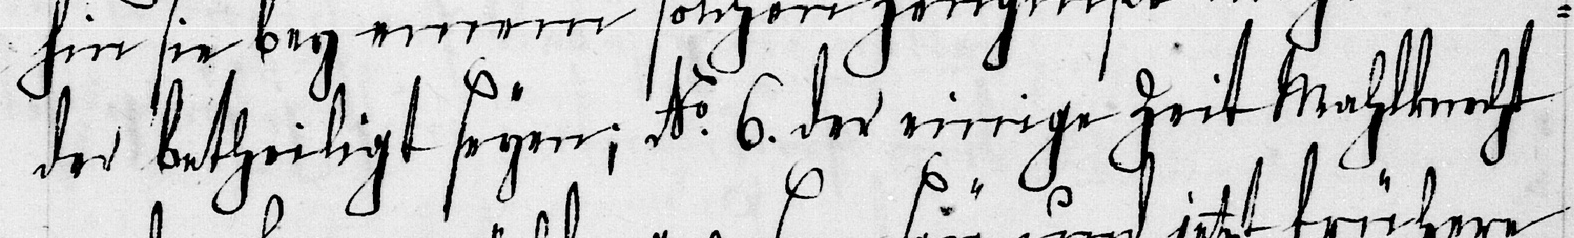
der betheiligt seyen; No. 6. der einige Zeit Mahlknecht
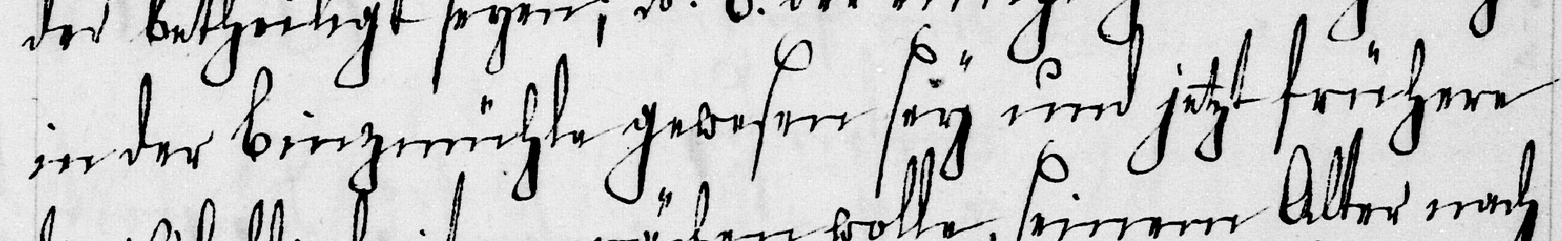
in der Binzmühle gewesen sey und jetzt frühere
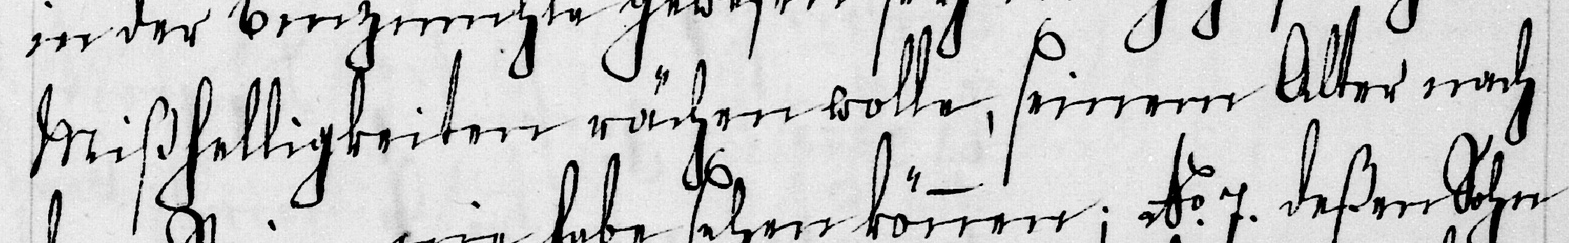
Mißhelligkeiten rächen wolle, seinem Alter nach
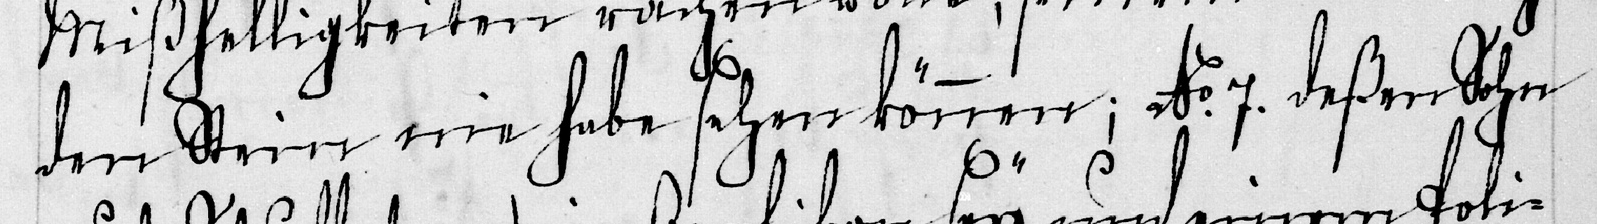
den Stein nie habe sehen können; No. 7. deßen Sohn
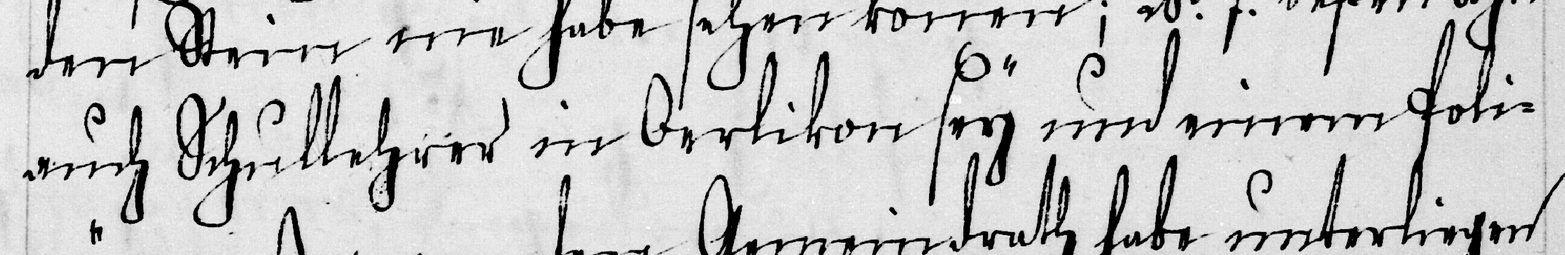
auch Schullehrer in Oerlikon sey und einem Poli¬
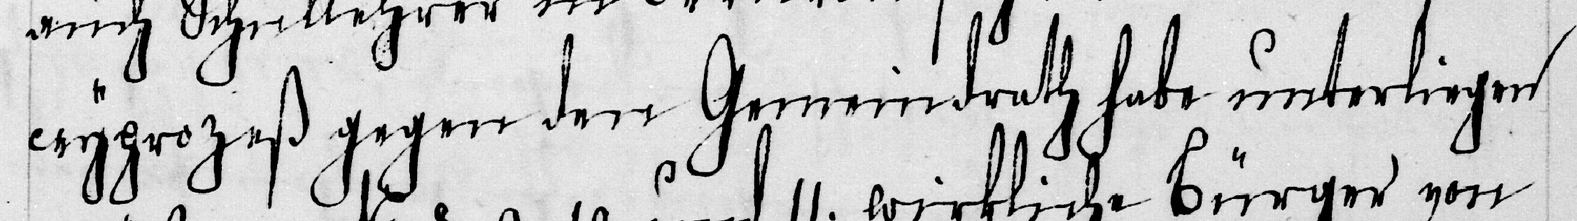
ceyprozeß gegen den Gemeindrath habe unterliegen
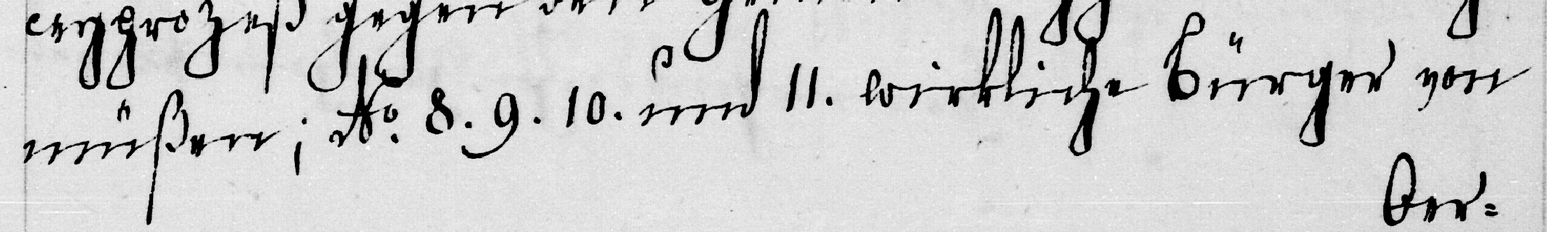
müßen; No. 8. 9. 10. und 11. wirkliche Bürger von
